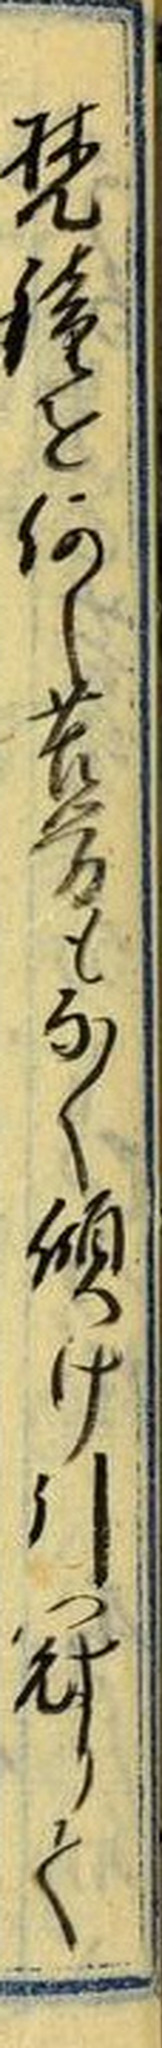梵鐘を何之苦労もなく傾け引冠りて
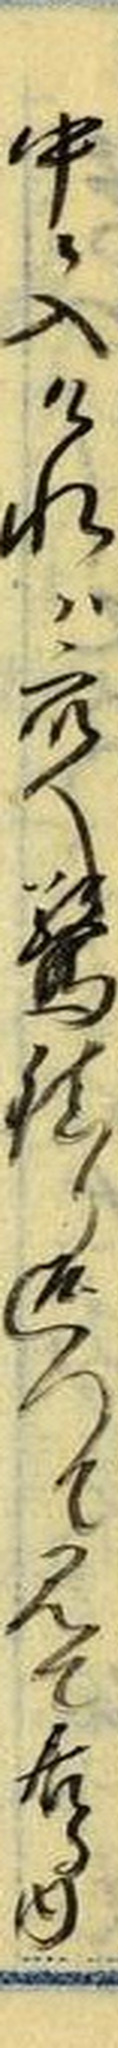中ニ入けれハ衆人驚鎮り返つて見て居る内
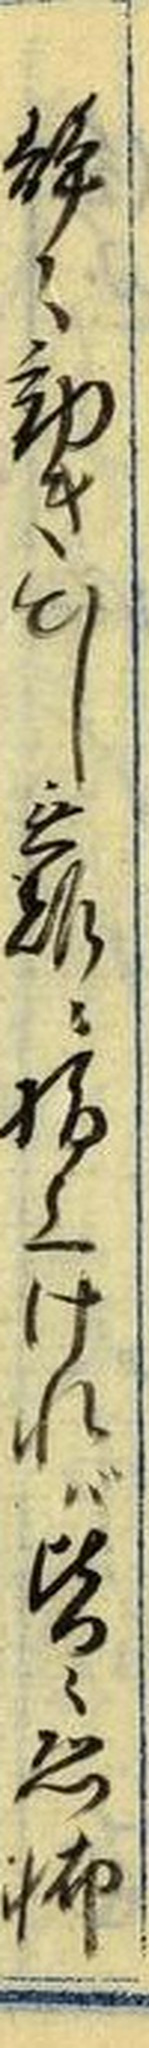静々動き出し無難ニ指上けれバ皆々恐怖
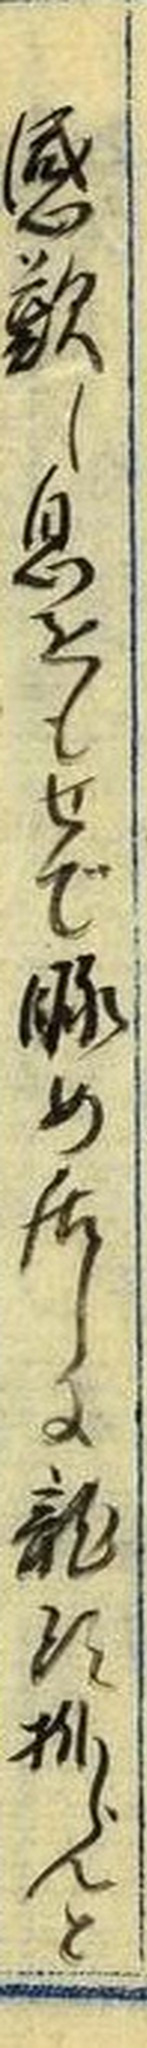感歎之息をもせで眺め居しに龍頭掛らんと
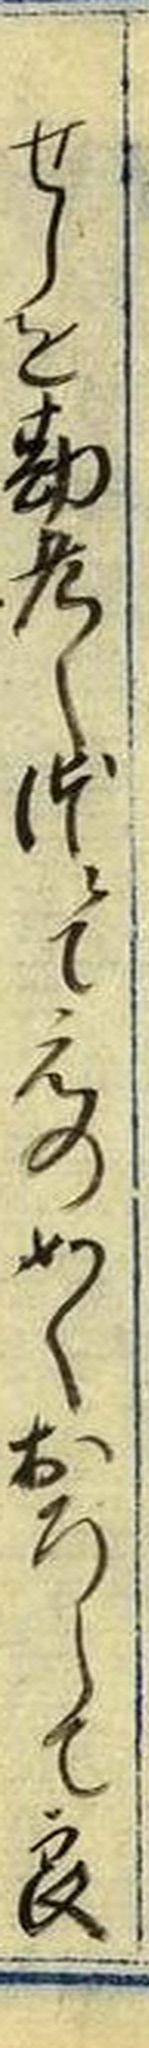せしを勘考之体ニて元の如くおろして良
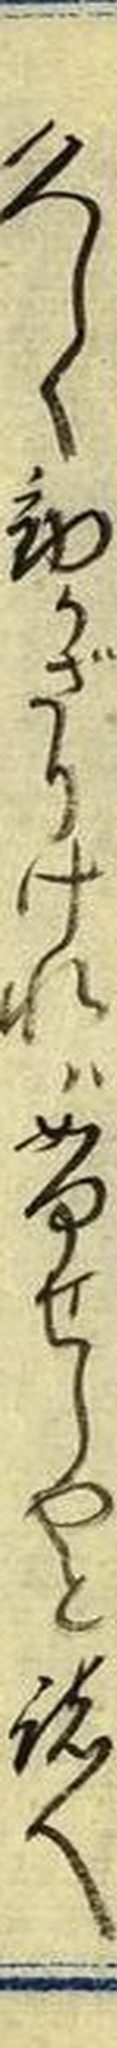久しく動かざりけれハ如何せしやと諸人
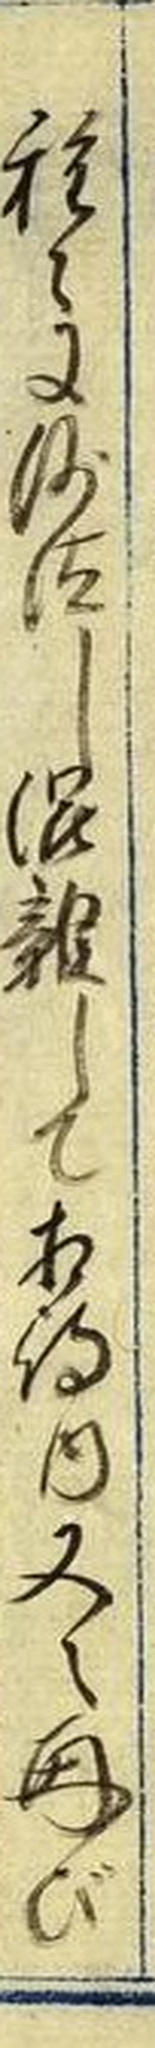種々に沙汰し混雑して相待内又々再び
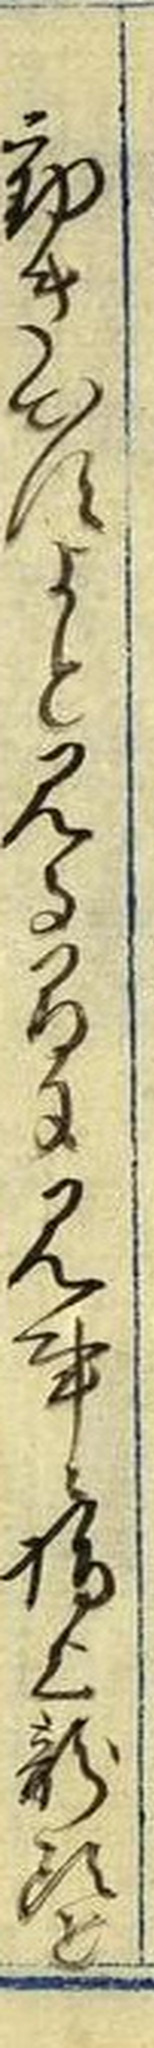動き出すよと見る間に見事ニ指上龍頭を
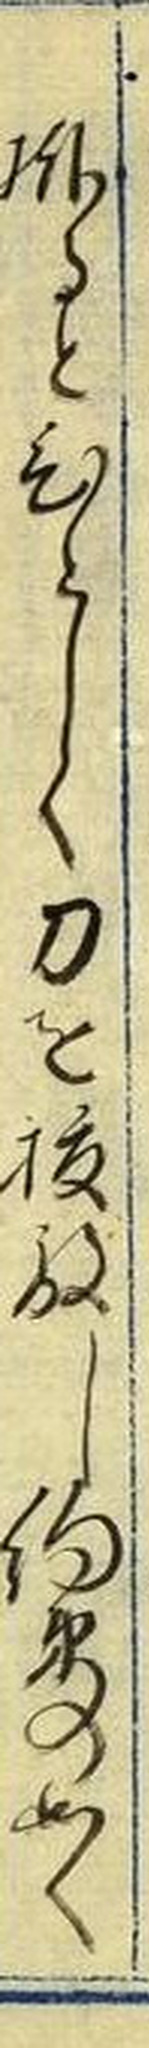掛るとひとしく刀を抜放し約束の如く
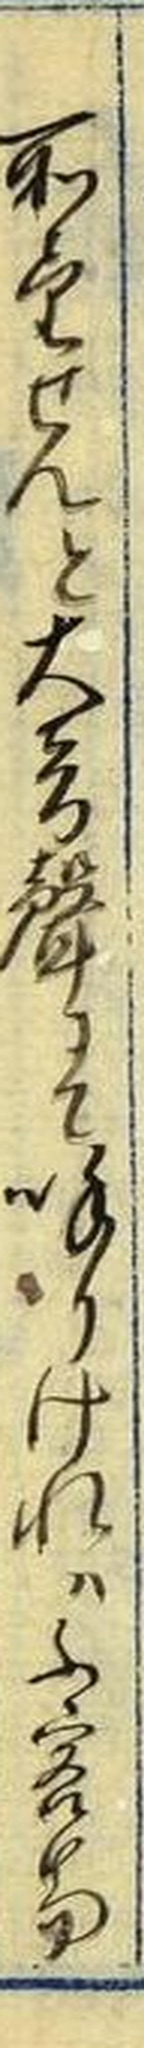所望せんと大音声にて呼りけれハ不容易

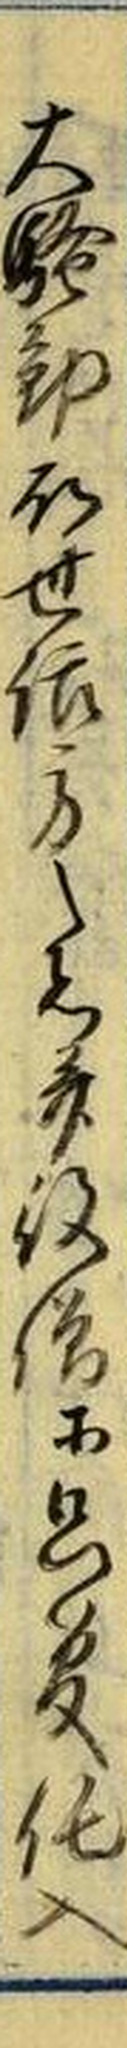大騒動故世話方之者并役僧等只管仛入
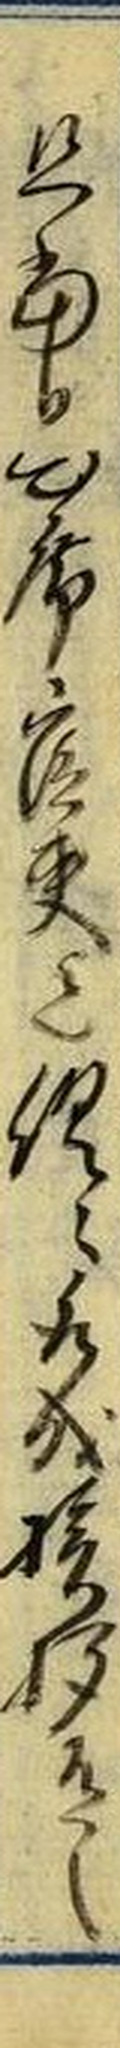且当日出席官吏迄倶々取成挨拶有之
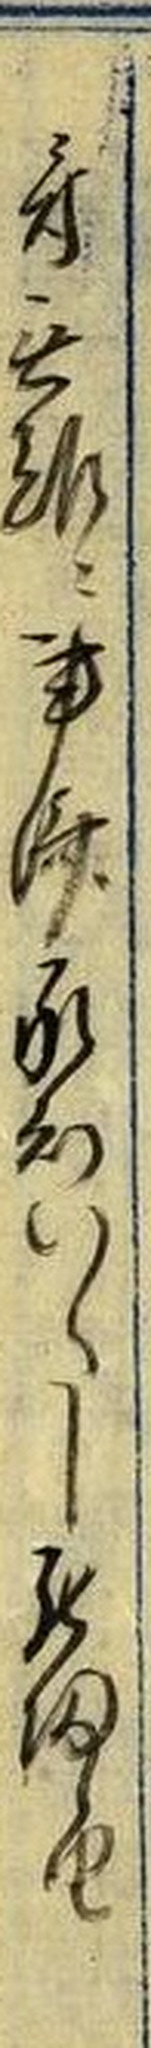ニ付無難ニ事済承知いたし罷帰候由
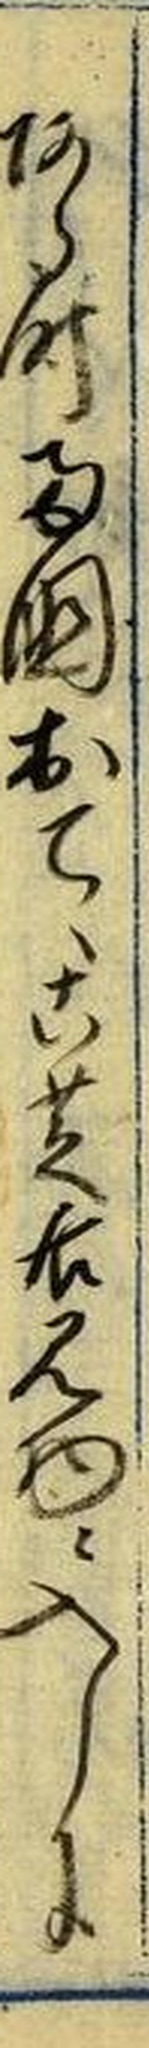ある時両国おてゝこ芝居見物ニ入しに
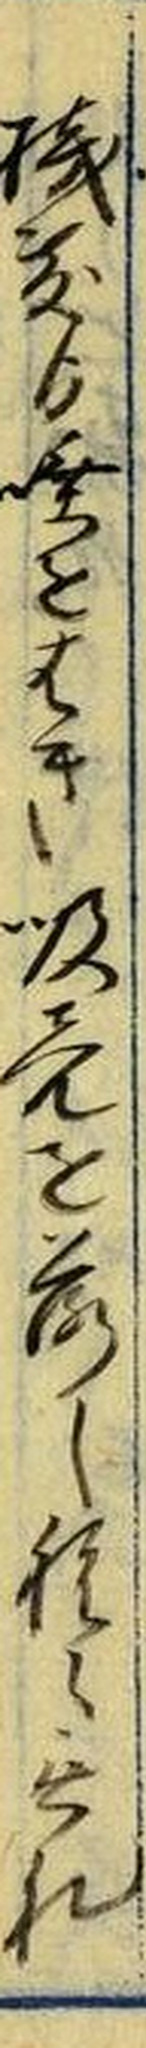桟敷ゟ唾をはき吸売を落し種々無礼
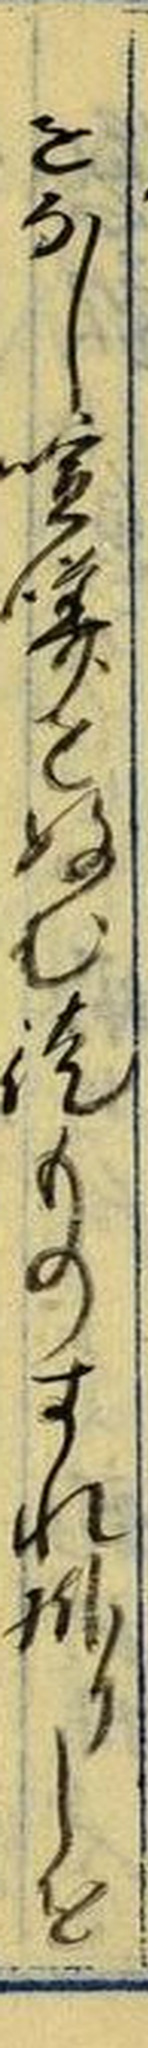をなし喧嘩を好む徒ものすれ掛りしを
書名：温古集 三巻
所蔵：福井県文書館 Fukui Prefectural Archives
